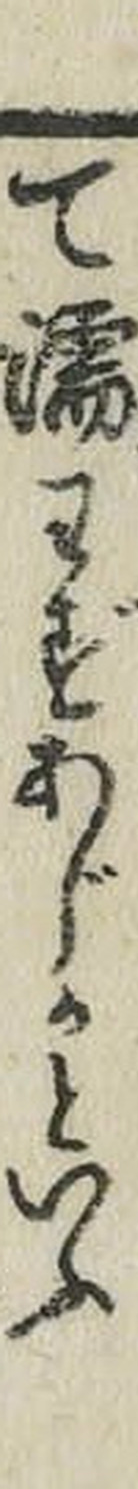て濡わずあじかといふ
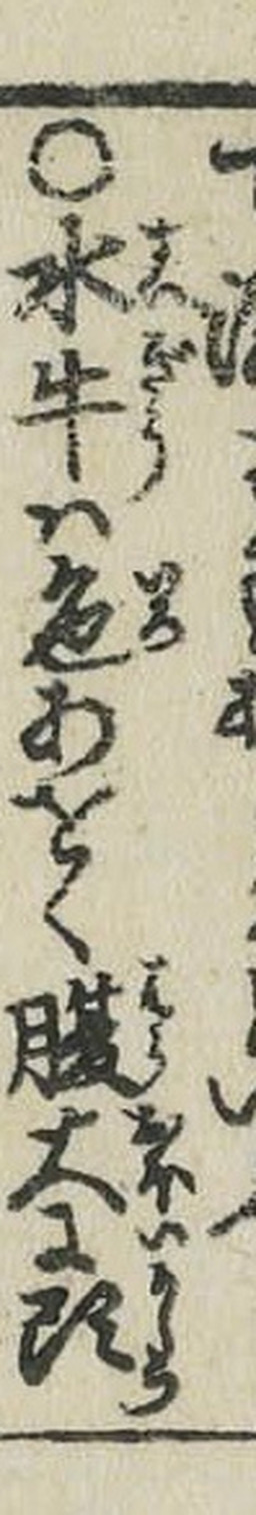○水牛は色あをく腹大に頭
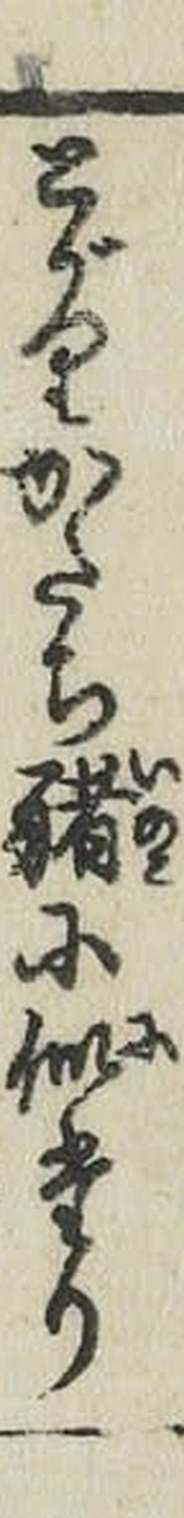とがりかたち豬に似たり
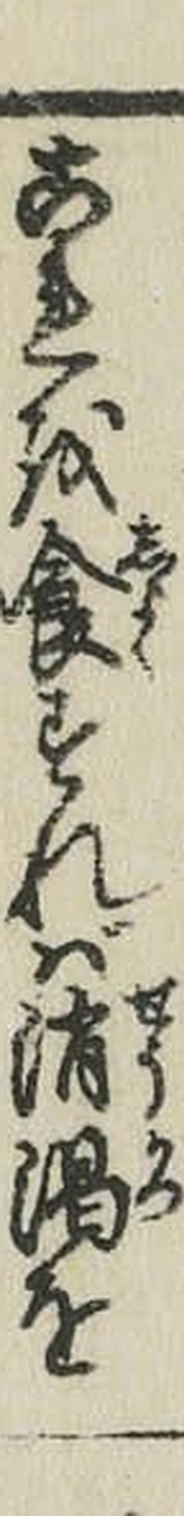これを食すれば消渇を
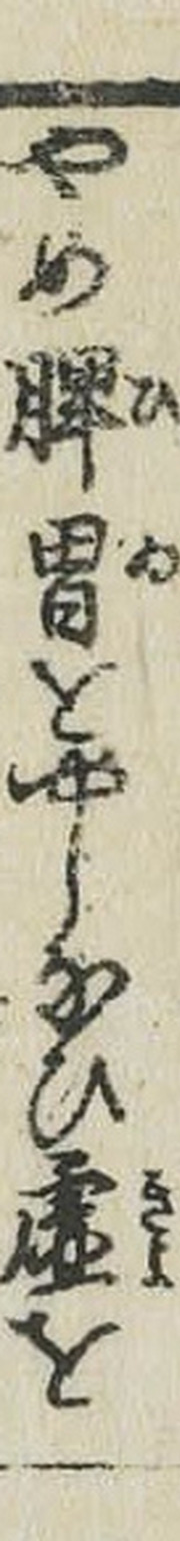やめ脾胃をやしなひ虚を
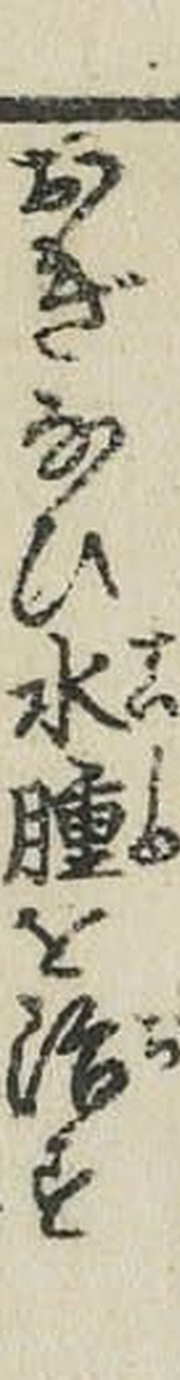おぎなひ水腫を治す
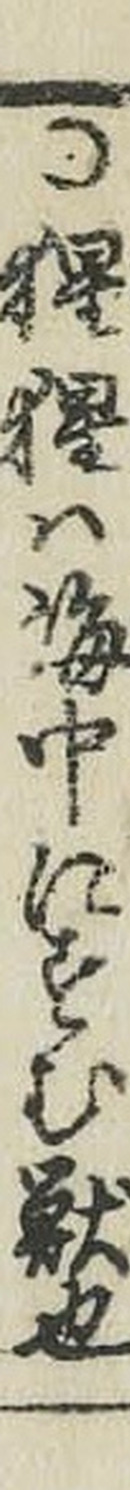○猩猩は海中にすむ獣也
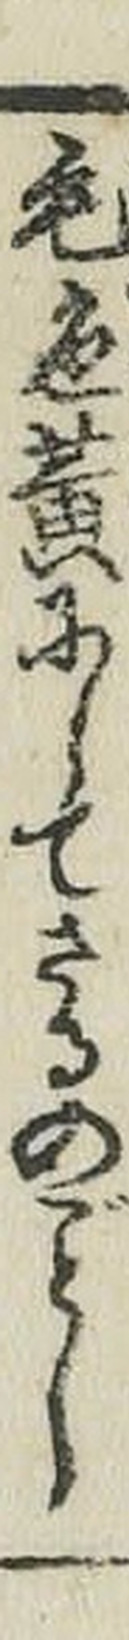毛色黄にしてさるのごとし
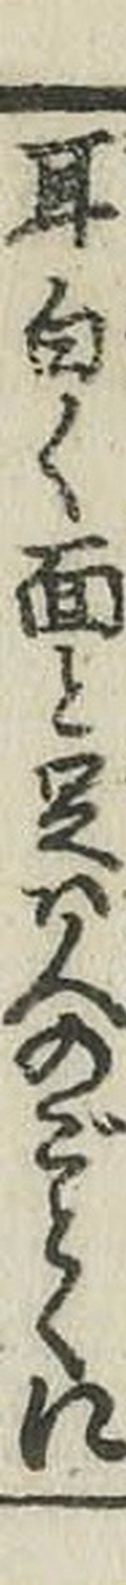耳白く面と足は人のごとくに
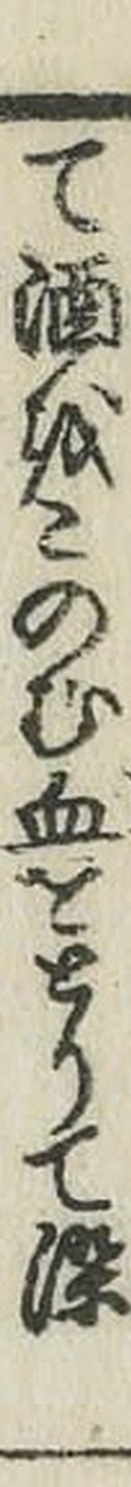て酒をこのむ血をとりて染
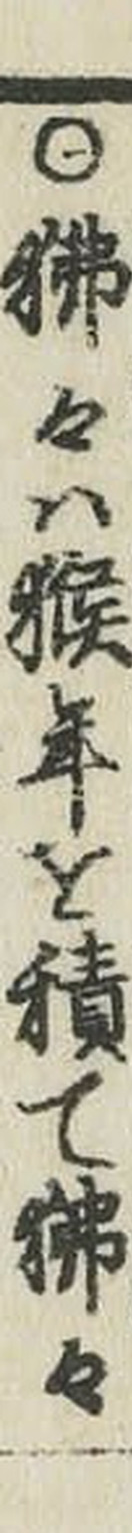○狒々は猴年を積て狒々
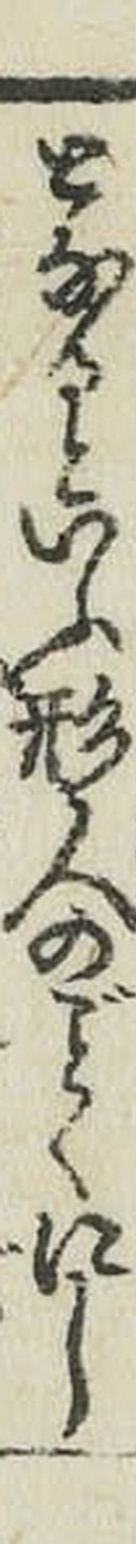となるといふ形人のごとくにし
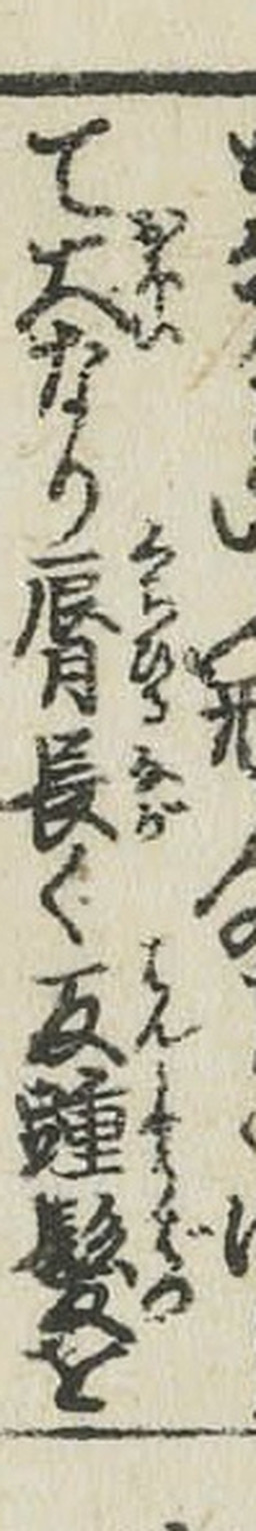て大なり脣長く反踵髪を
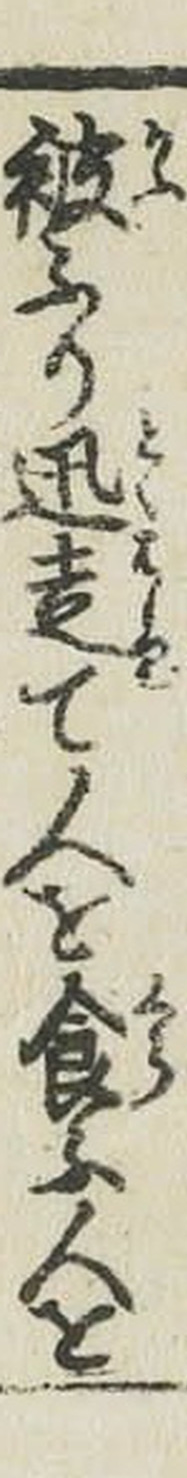被ふり迅走て人を食ふ人を
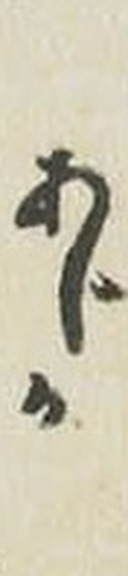あじか
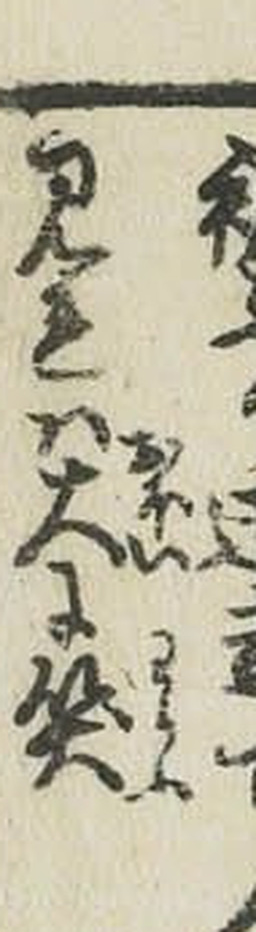見れは大に笑
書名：増補頭書訓蒙図彙大成 10巻 6:巻之12-13
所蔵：東京学芸大学教育コンテンツアーカイブ
